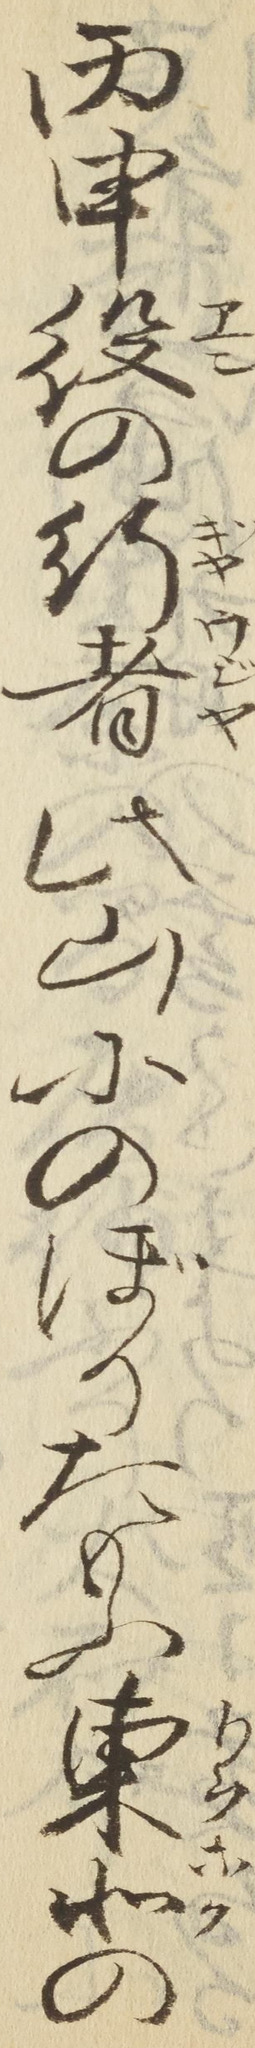丙申役の行者此山にのぼりたもふ東北の
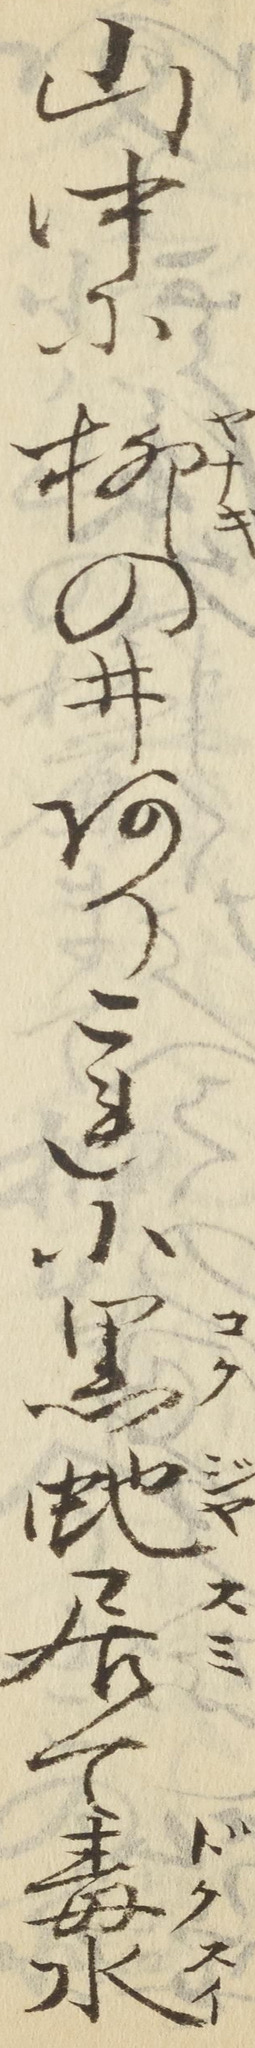山中に柳の井ありこれに黒蛇居て毒水
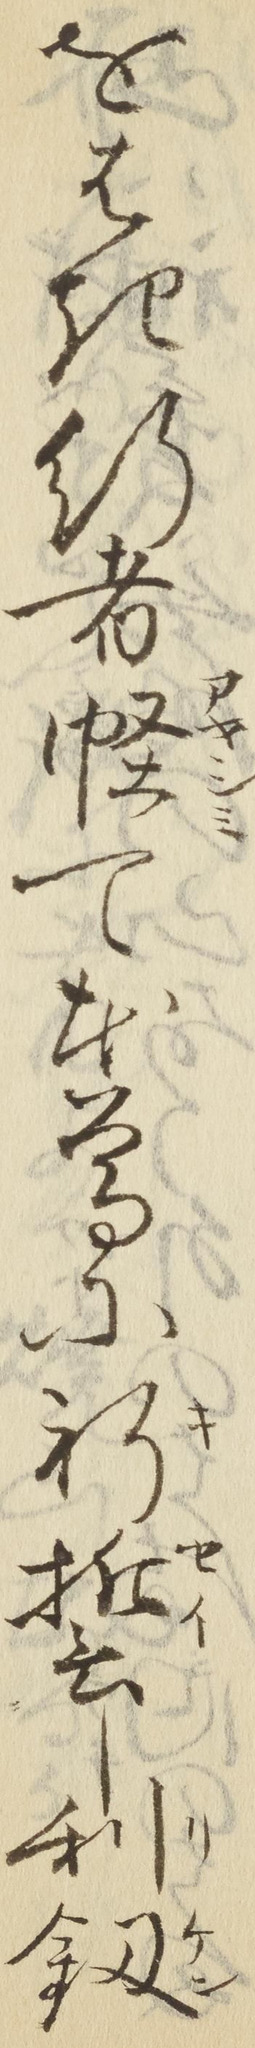をはき行者怪て本尊に祈誓し利釼
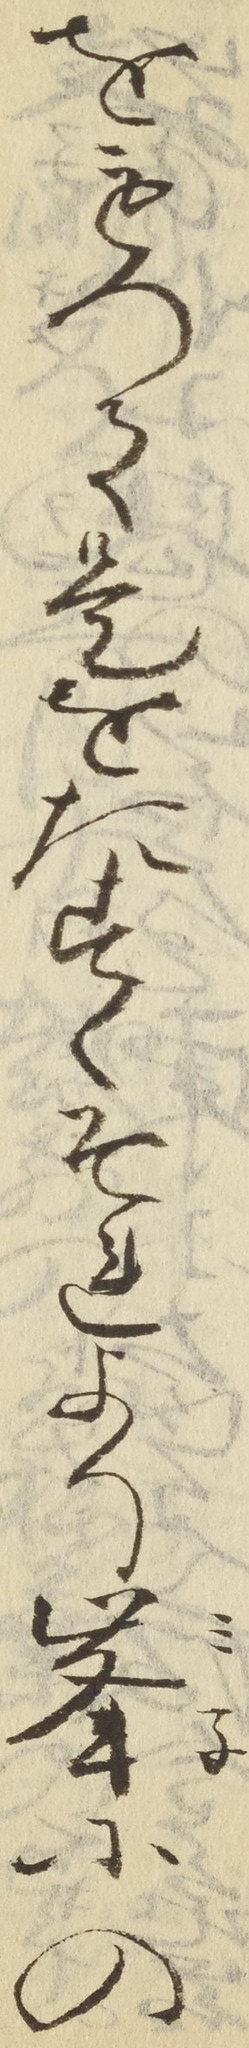をもつて是をたすくそれより峯にの
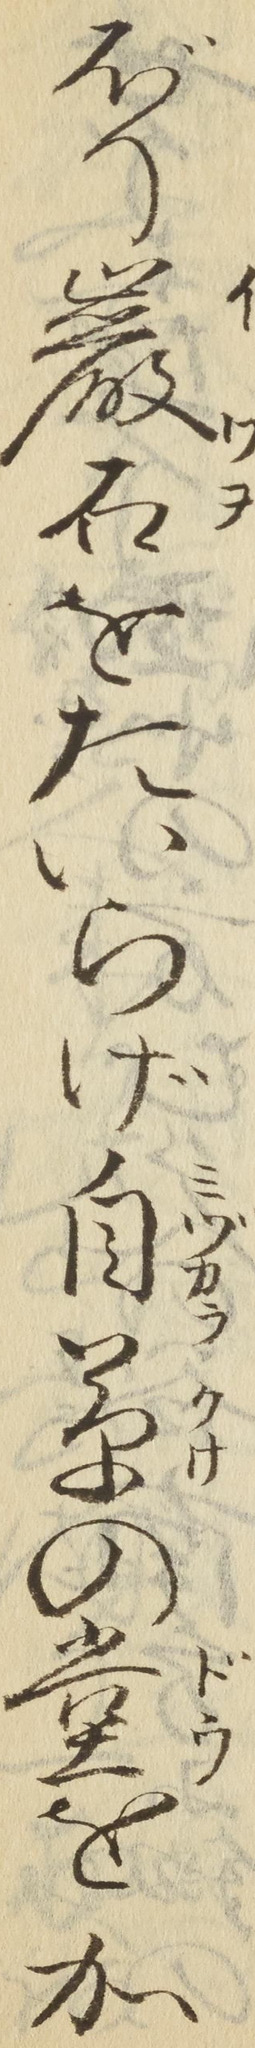ぼり巌石をたいらげ自草の堂をか
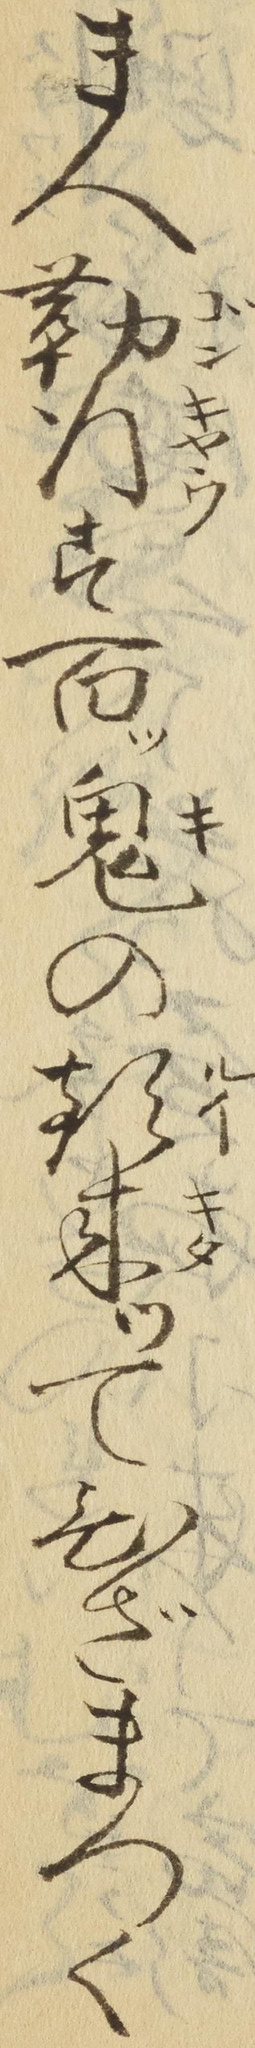まへ勤行す百ッ鬼の類来ッてひざまつく

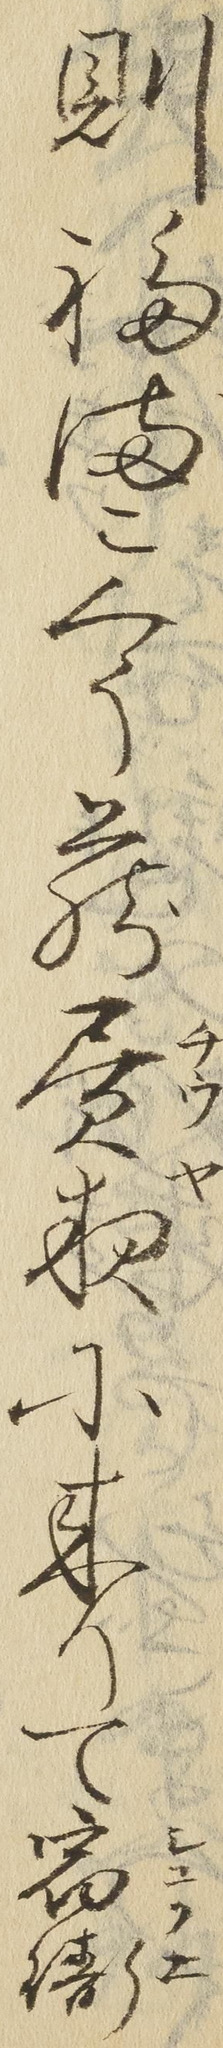則福満こくう蔵昼夜に来りて宿衛
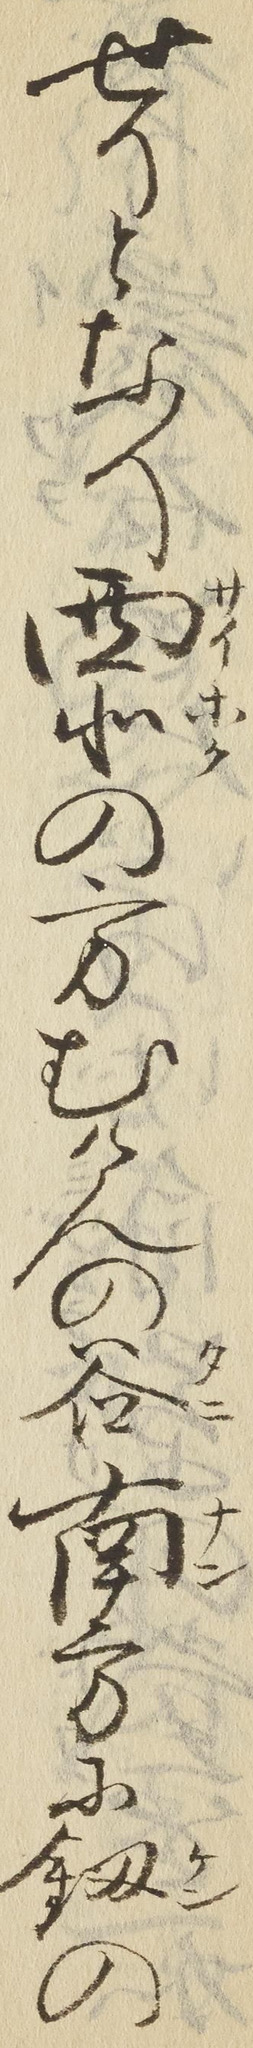せりとなり西北の方むけんの谷南方に釼の
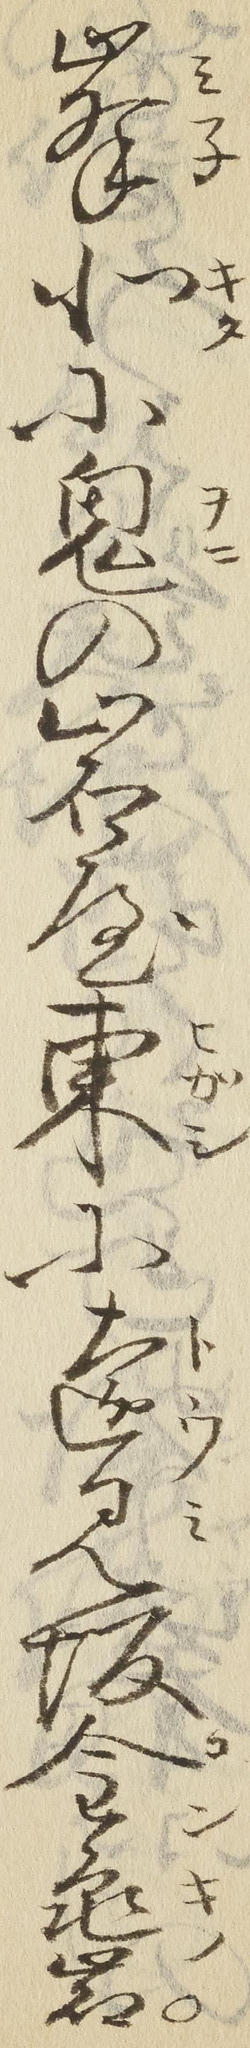峯北に鬼の岩屋東に遠見坂金亀岩
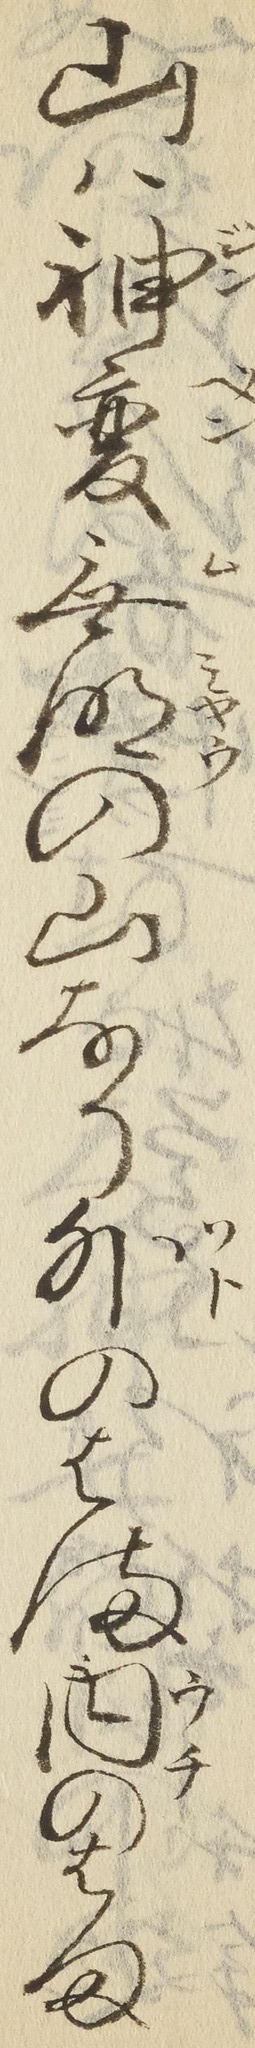山は神変無明の山なり外のはま内のはま
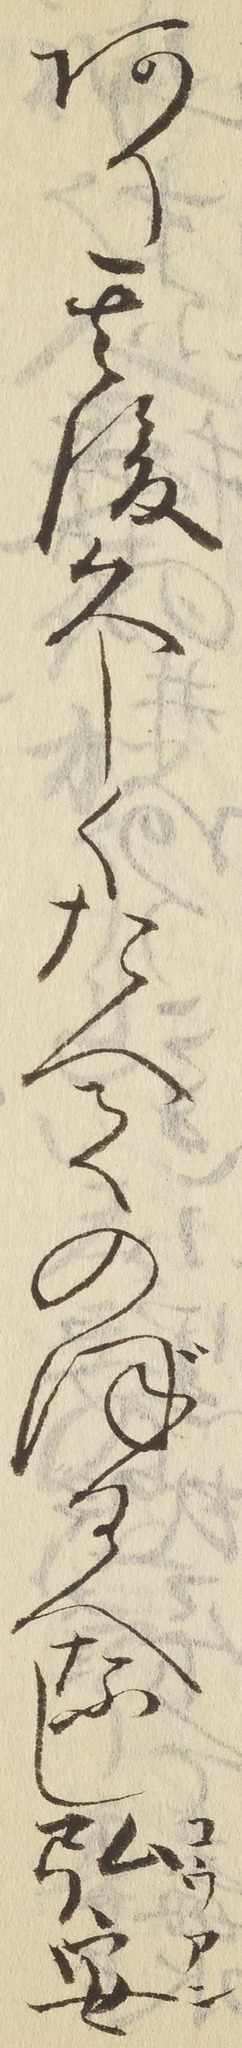あり其後久しくたへてのぼる人なし弘安
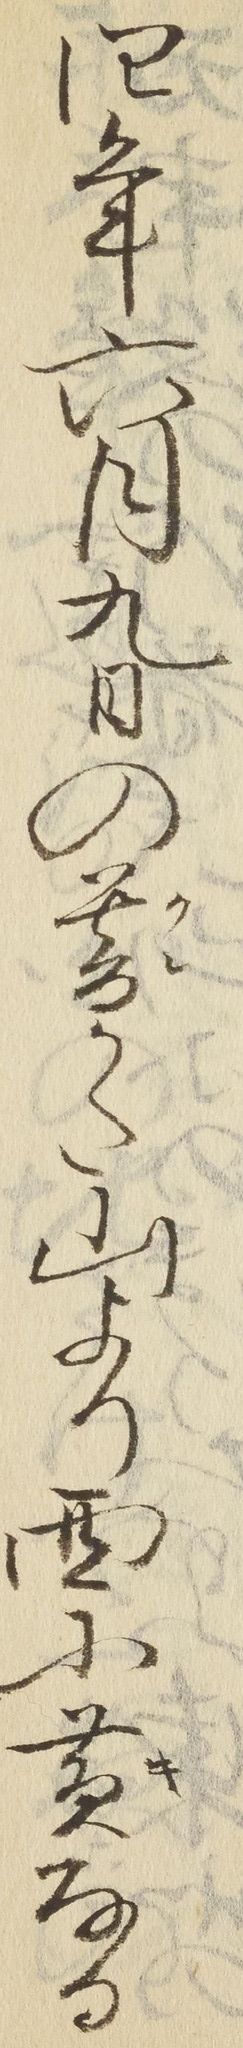四年六月九日の暮かた山より西に黄なる
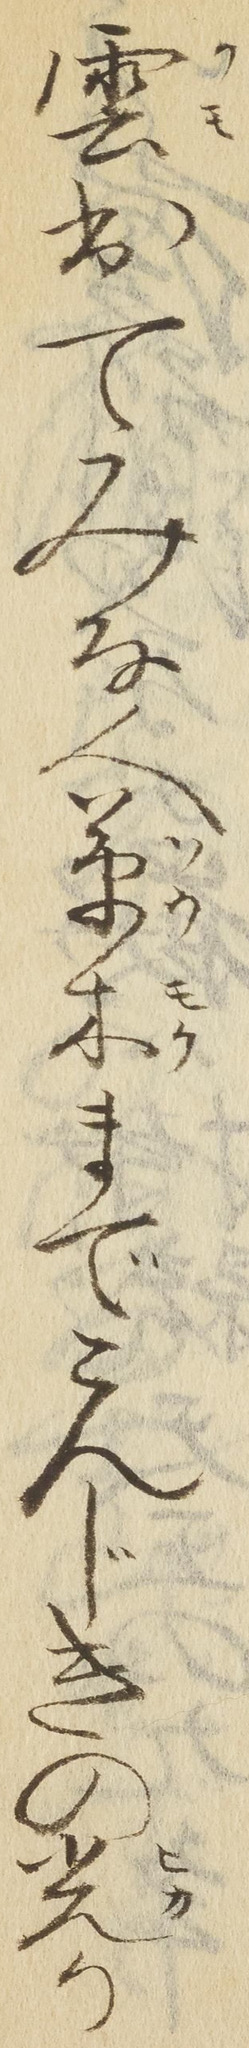雲出てみな人草木までこんじきの光り
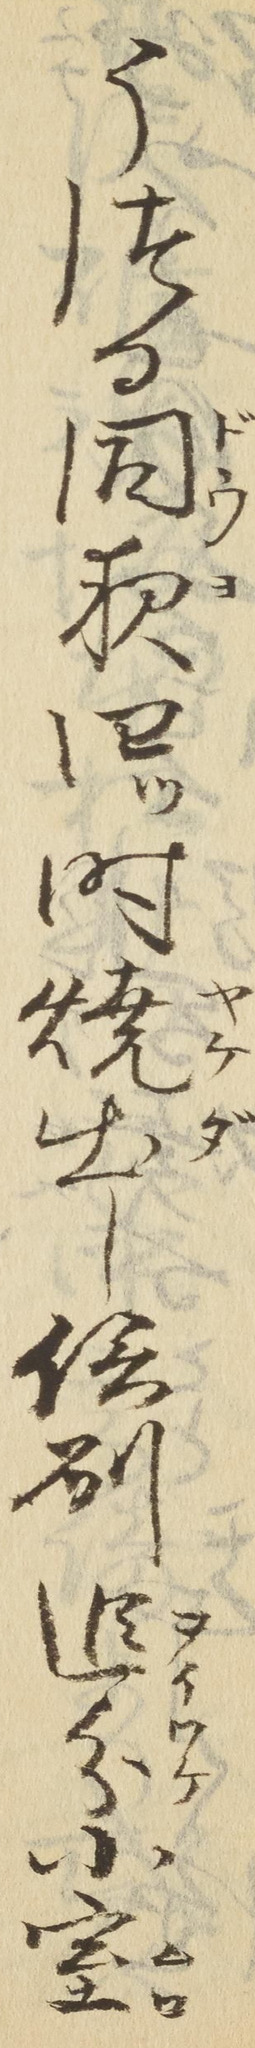うつる同夜四ッ時焼出し信州追分小室
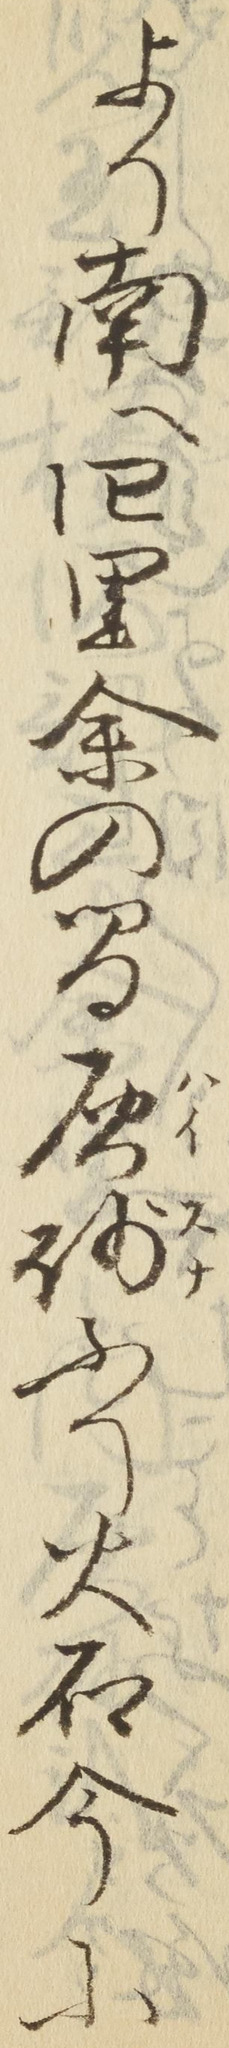より南へ四里余の間灰砂ふり火石今に
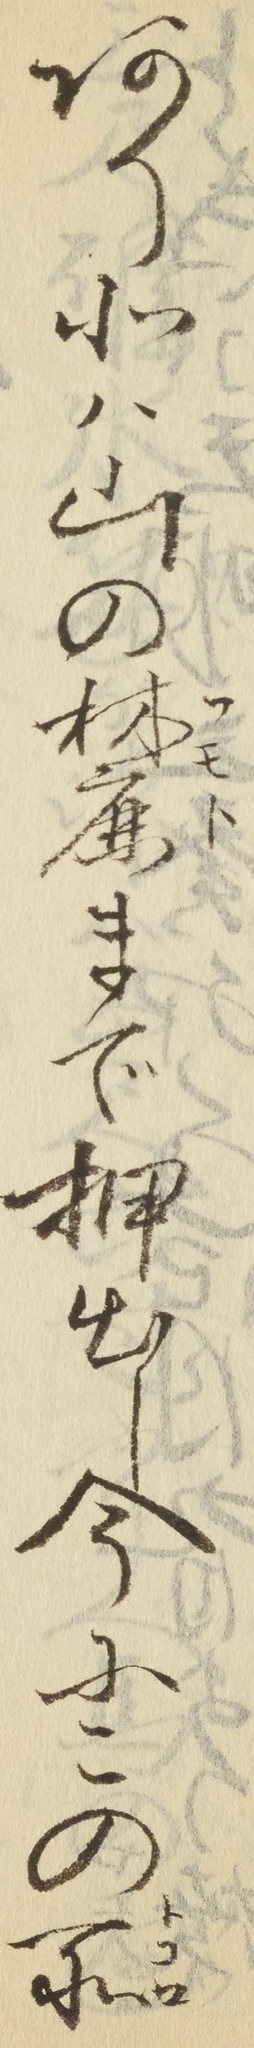あり北は山の麓まで押出し今にこの所
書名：浅間大變記
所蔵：東京大学地震研究所図書室 Earthquake Research Institute Library, The University of Tokyo, JAPAN
